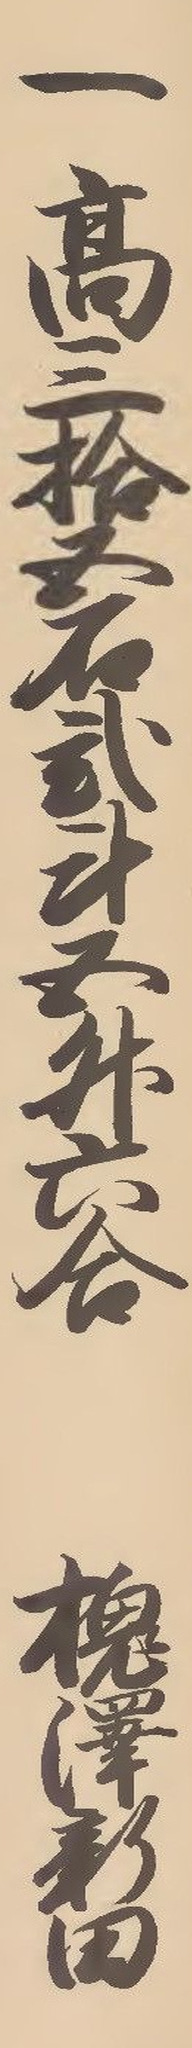一高三拾五石弐斗五升六合槐沢新田
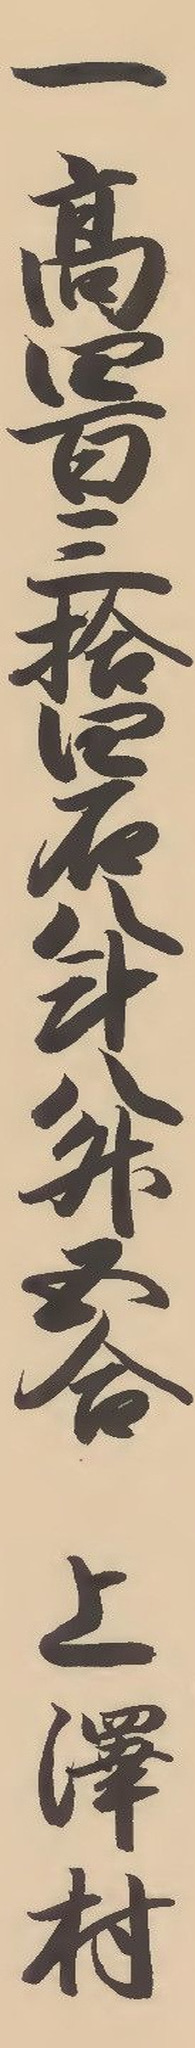一高四百三拾四石八斗八升五合上沢村
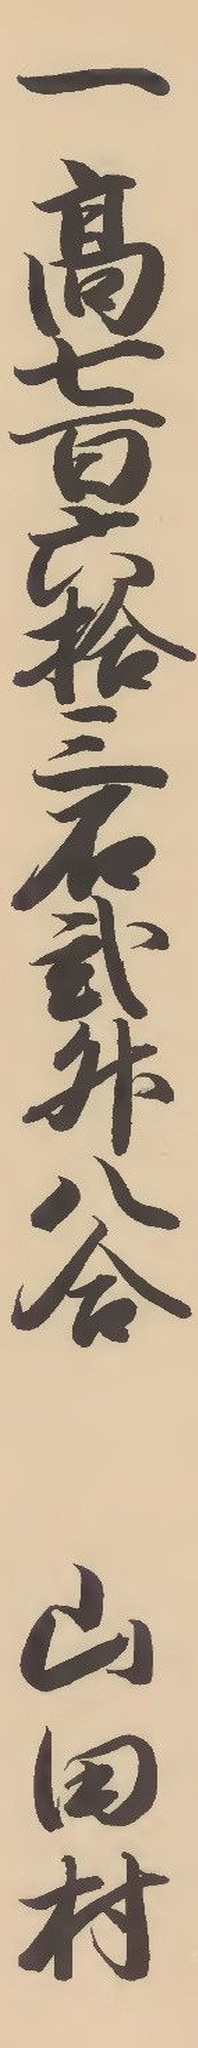一高七百六拾三石弐升八合山田村
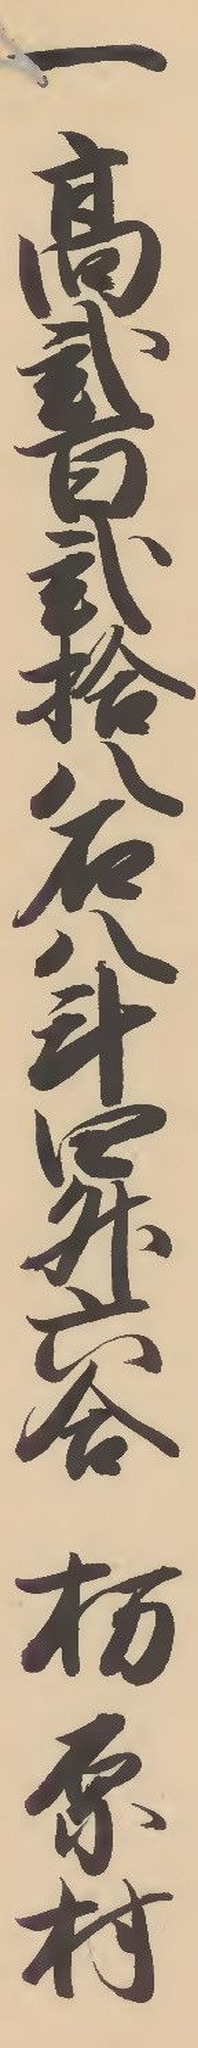一高弐百弐拾八石八斗四升六合栃原村

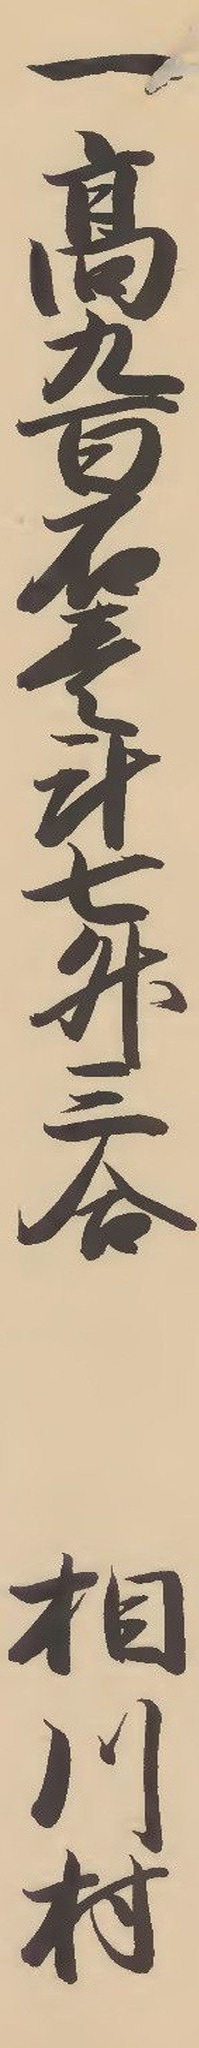一高九百石壱斗七升三合相川村
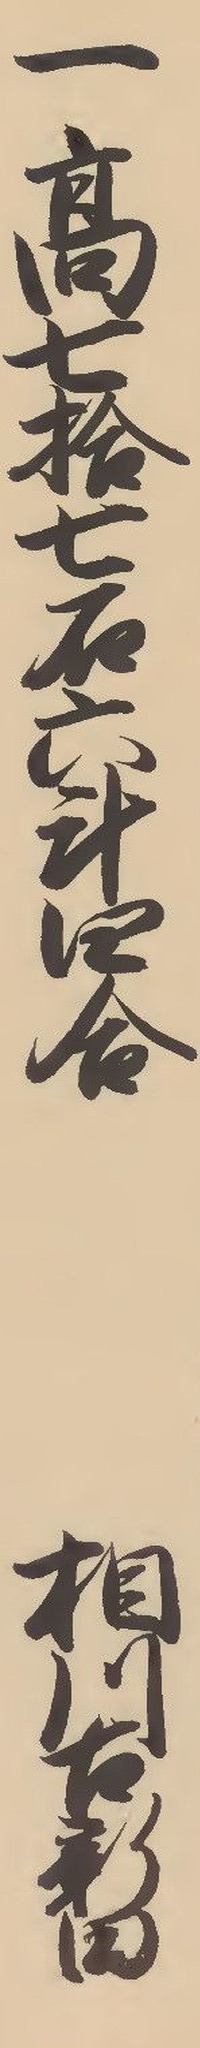一高七拾七石六斗四合相川古新田
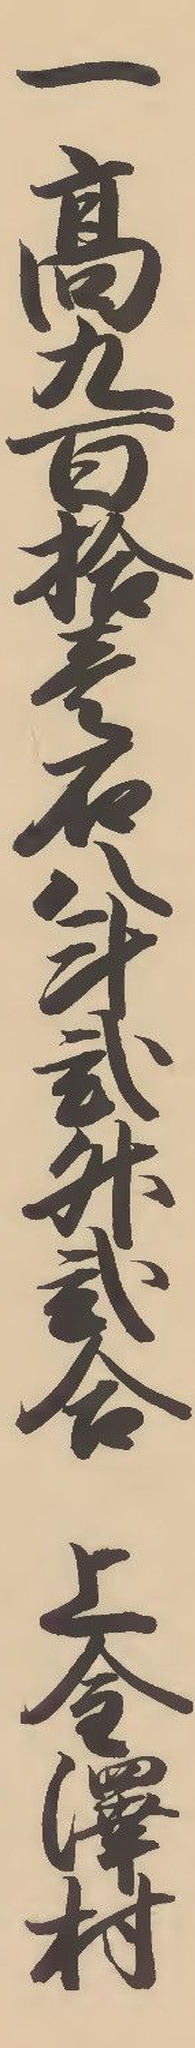一高九百拾壱石八斗弐升弐合上金沢村
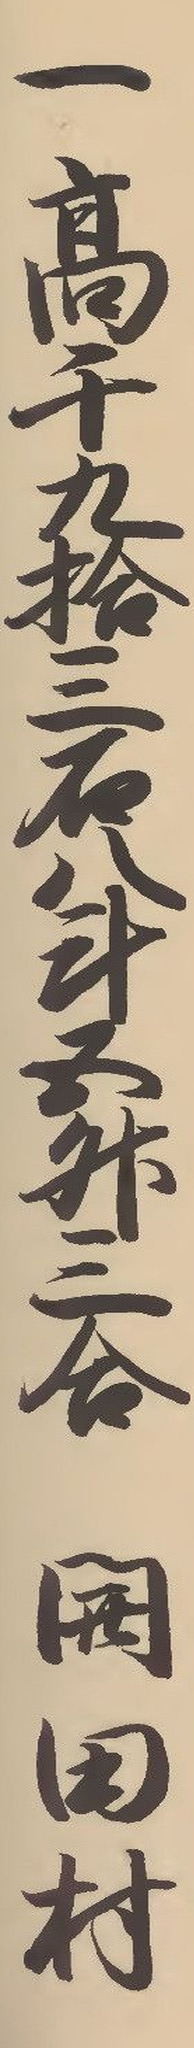一高千九拾三石八斗五升三合開田村
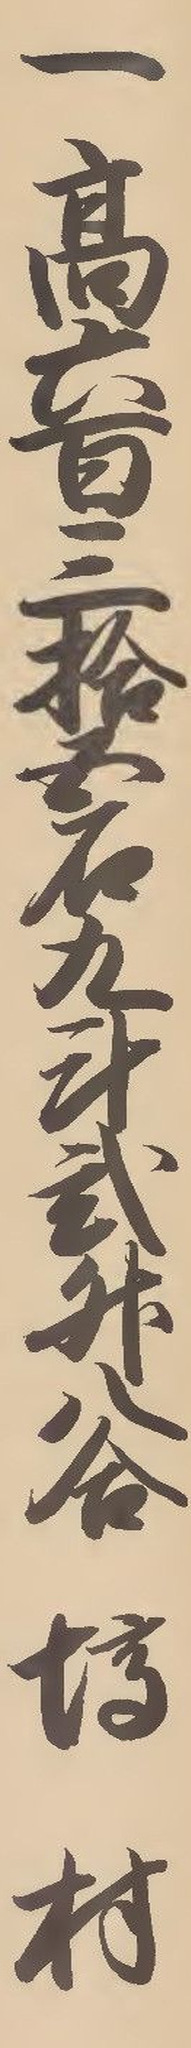一高六百三拾五石九斗弐升八合塙村
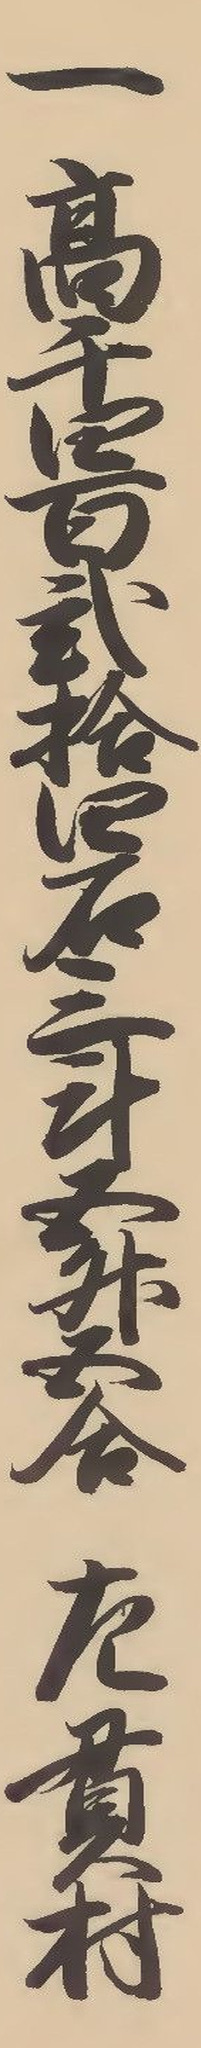一高千四百弐拾四石三斗五升五合左貫村
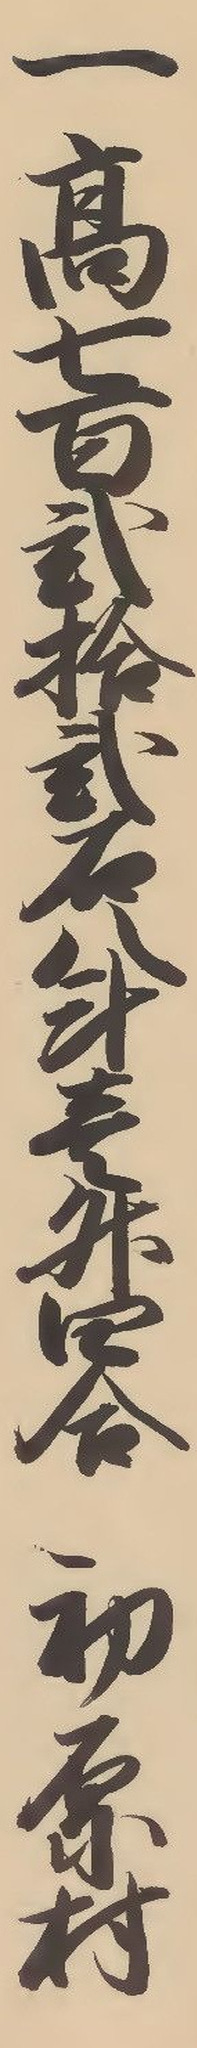一高七百弐拾弐石八斗壱升四合初原村
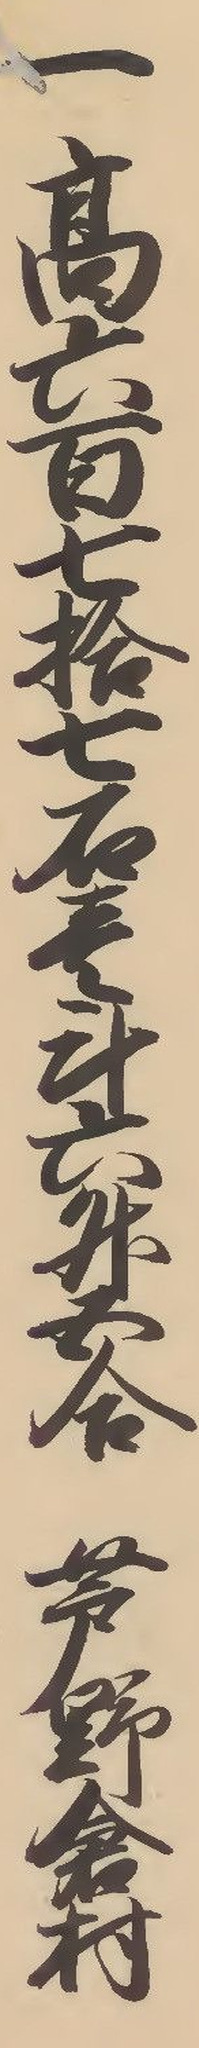一高六百七拾七石壱斗六升五合芦野倉村

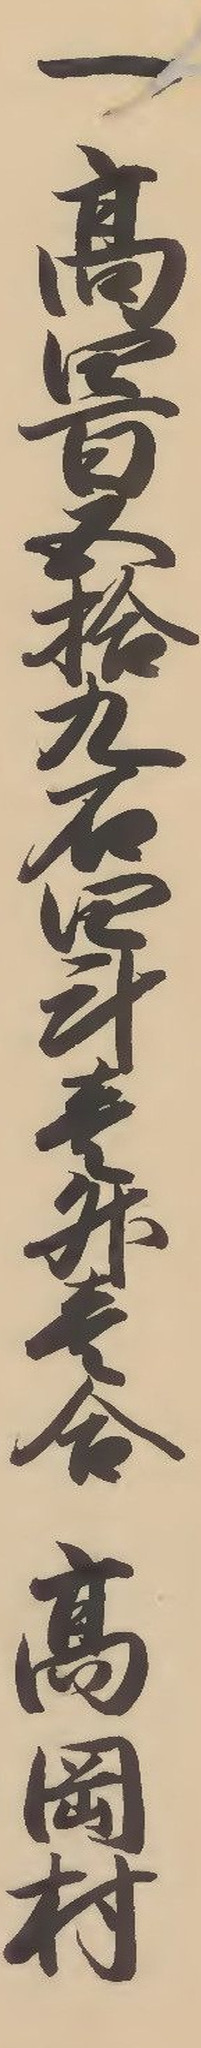一高四百五拾九石四斗壱升壱合高岡村
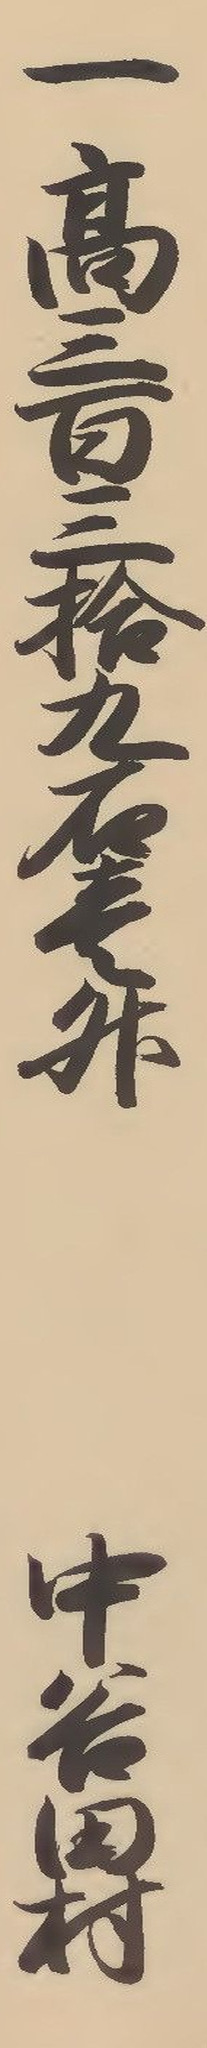一高三百三拾九石壱升中谷田村
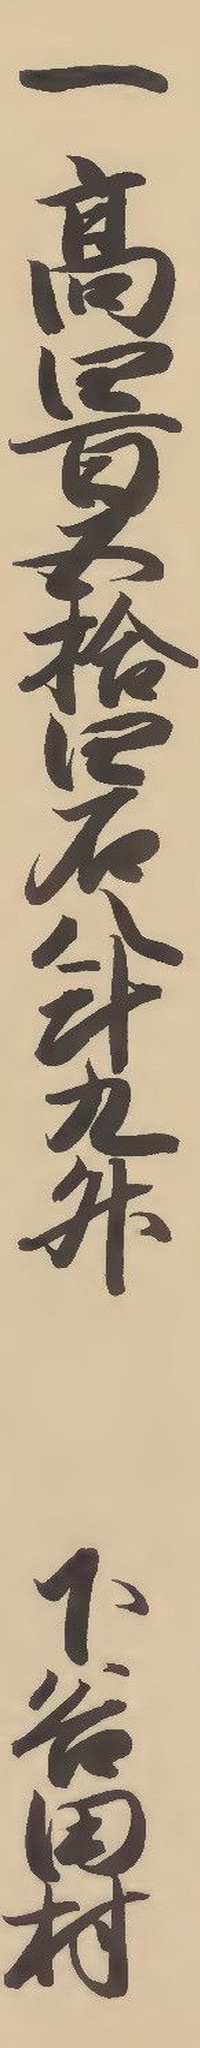一高四百五拾四石八斗九升下谷田村
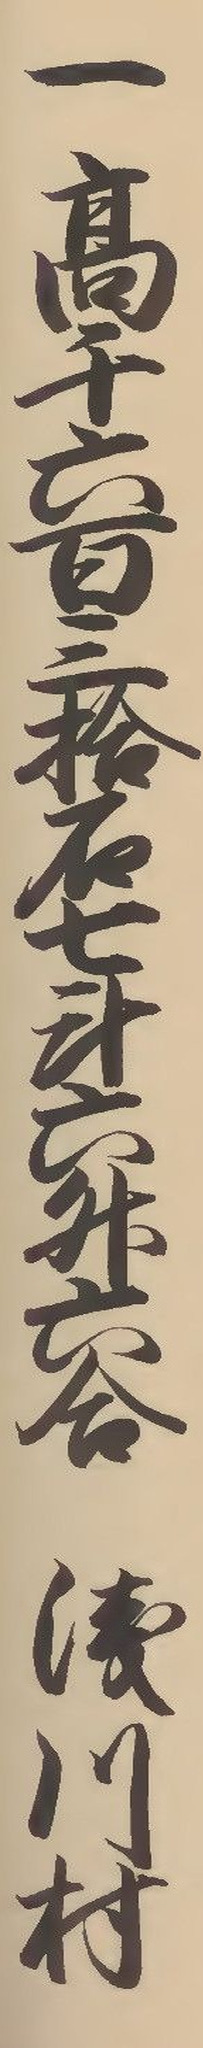一高千六百三拾石七斗六升六合浅川村
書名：常陸国郷帳
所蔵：国立公文書館 National Archives of Japan
